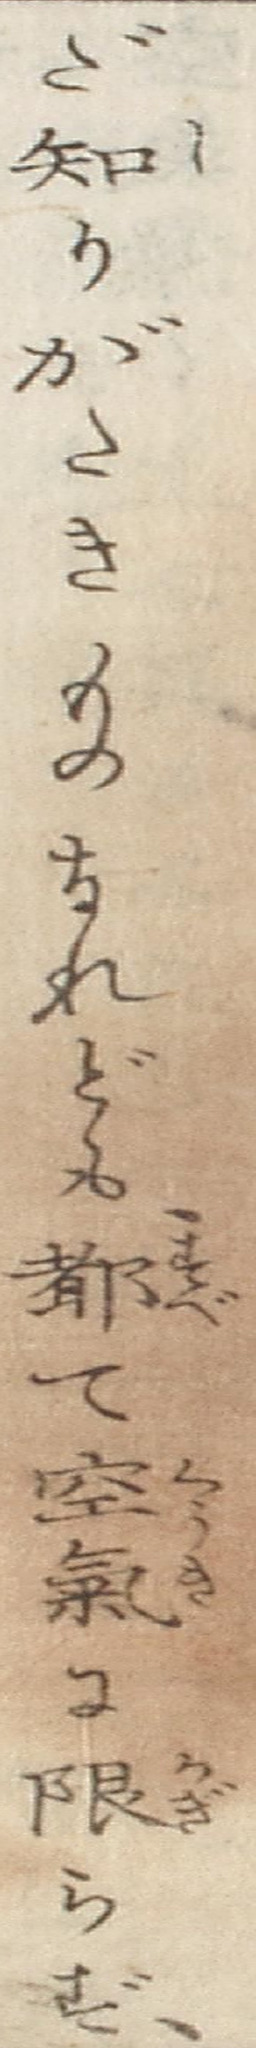だ知りがたきものなれども、都て空気に限らず、
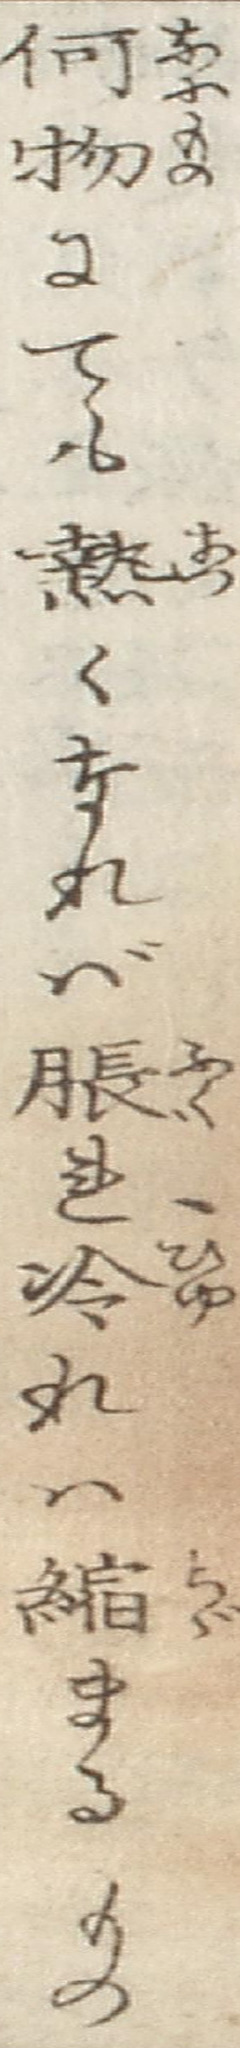何物にても熱くなれば脹れ、冷れは縮まるもの
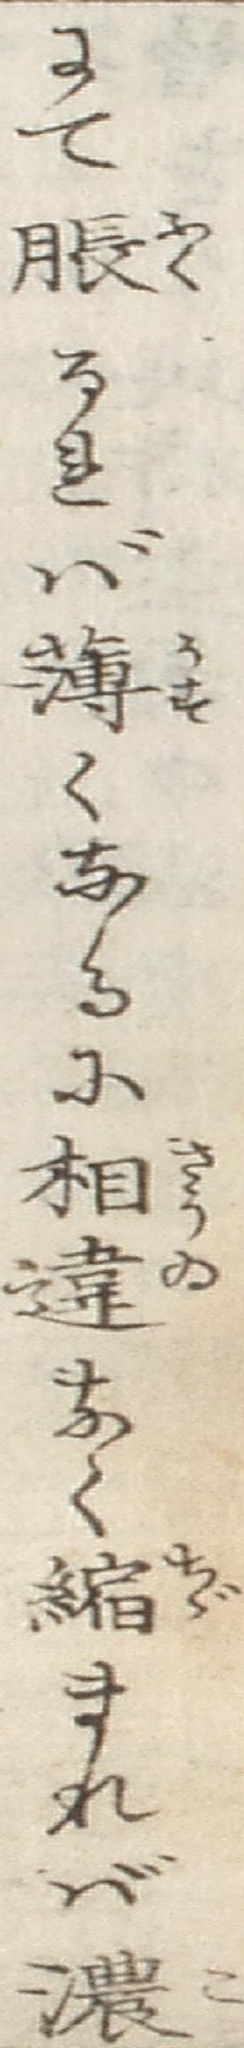にて脹るれば薄くなるに相違なく縮まれば濃
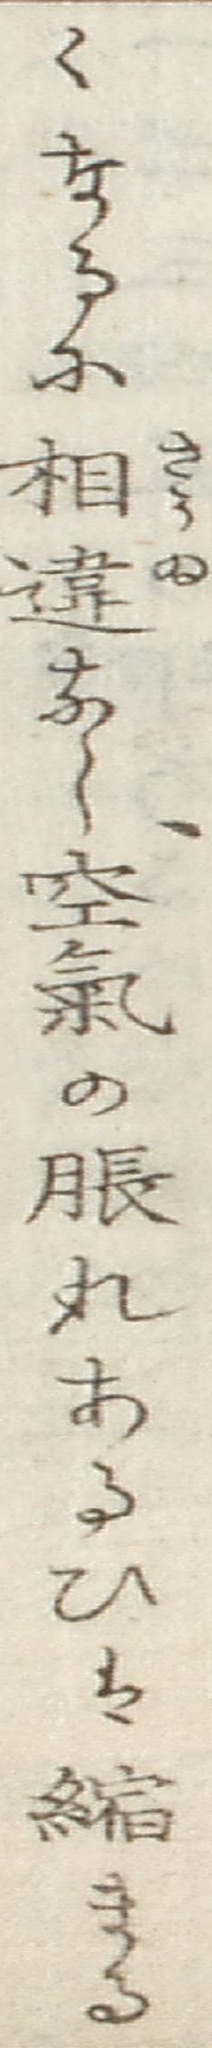くなるに相違なし、空気の脹れあるひは縮まる
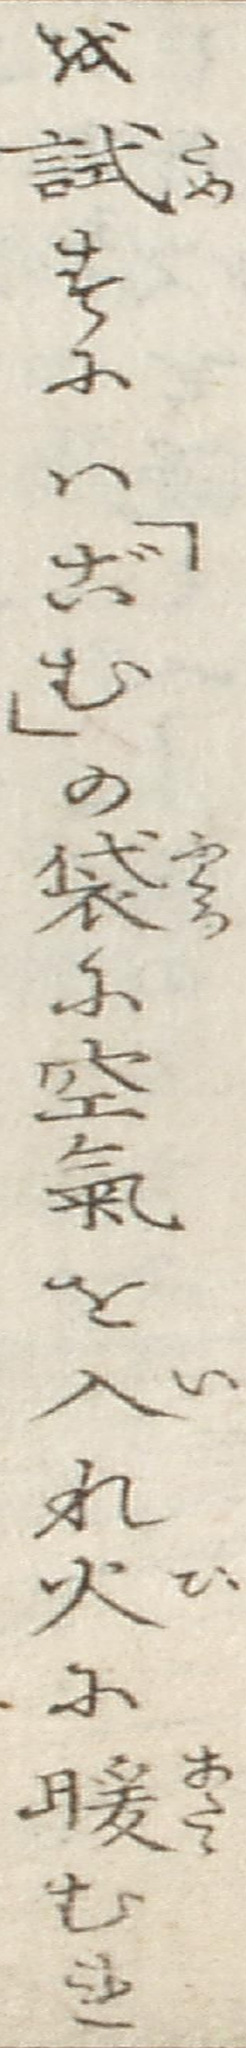を試すには「ごむ」の袋に空気を入れ火に暖むれ
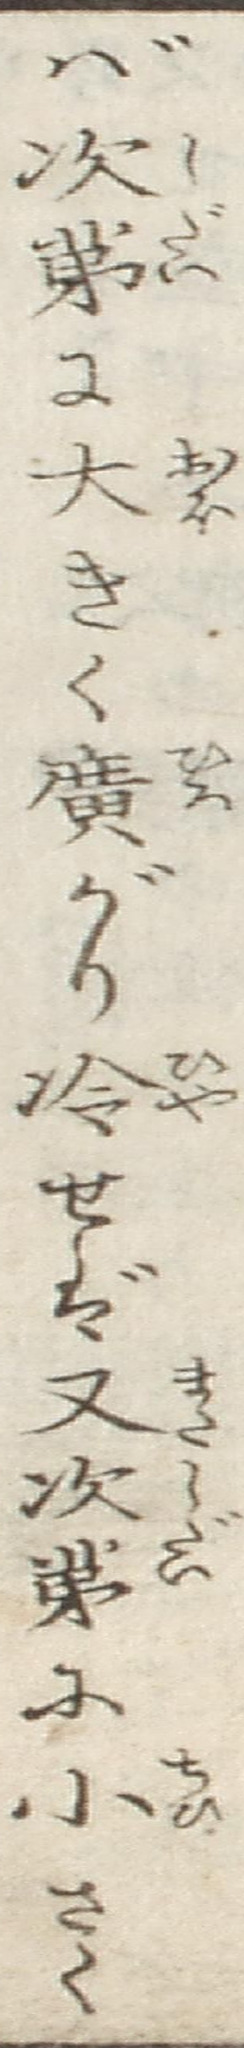ば次第に大きく広がり冷せば又次第に小さく
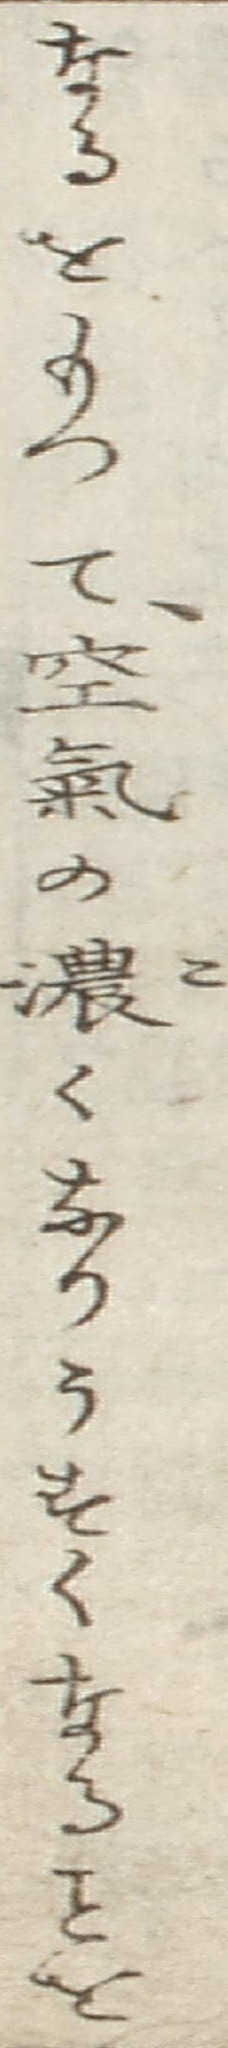なるをもつて、空気の濃くなりうすくなることを

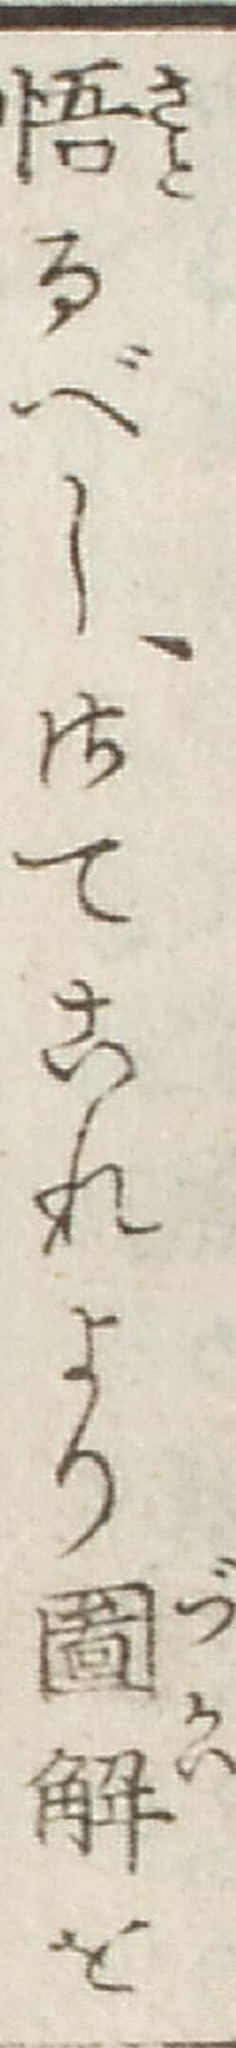悟るべし、さてこれより図解を
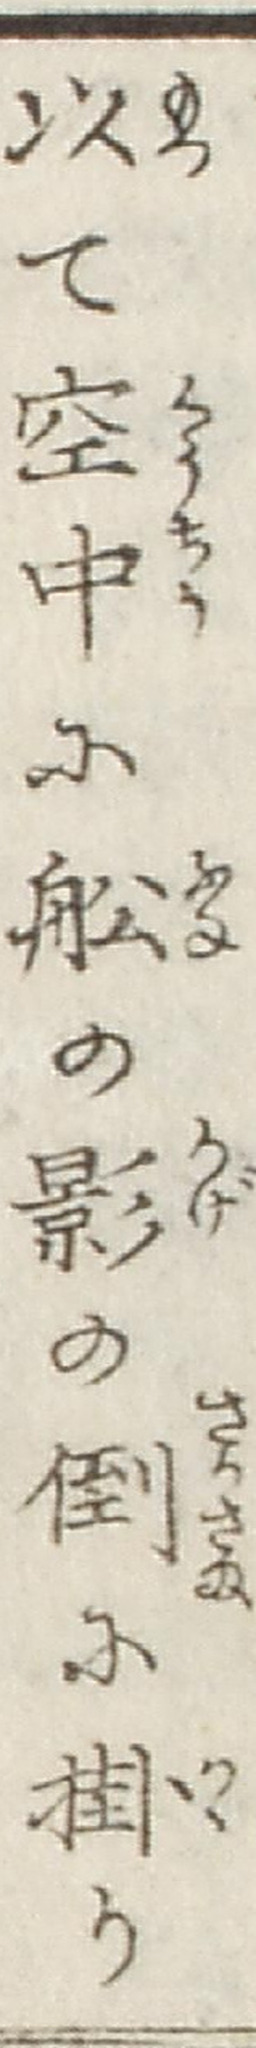以て空中に船の影の倒に掛り
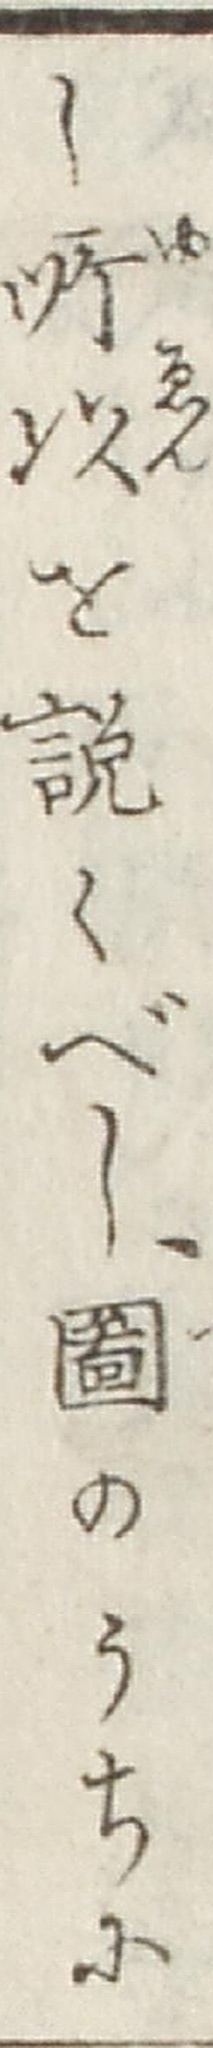し所以を説くべし、図のうちに
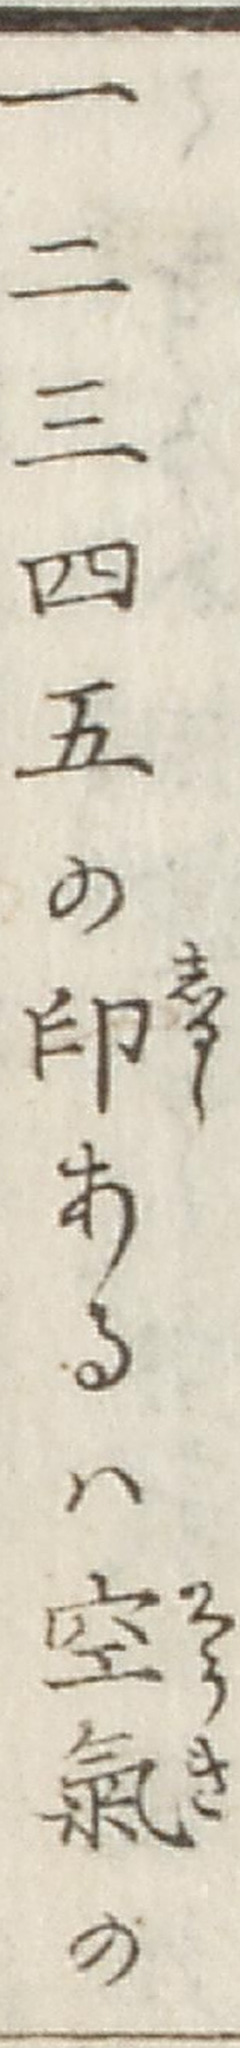一二三四五の印あるは空気の
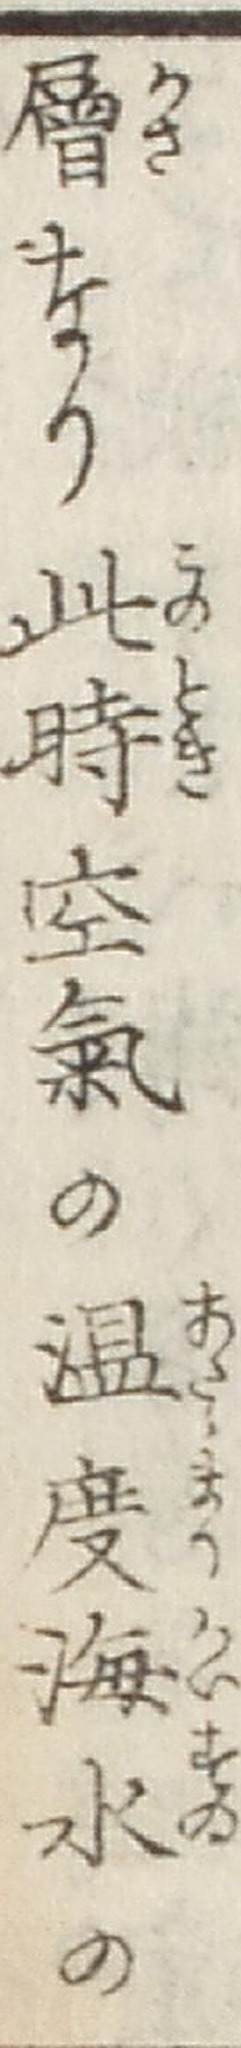層なり此時空気の温度海水の
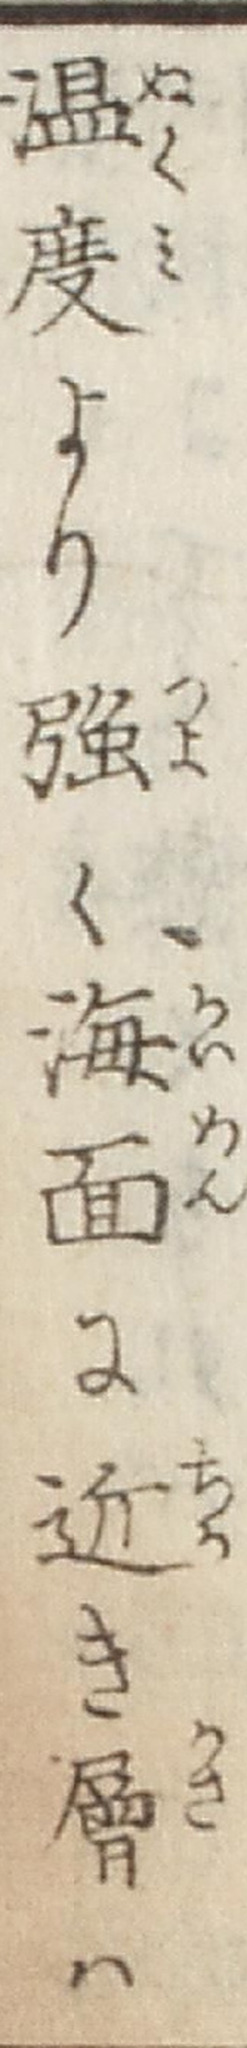温度より強く、海面に近き層は
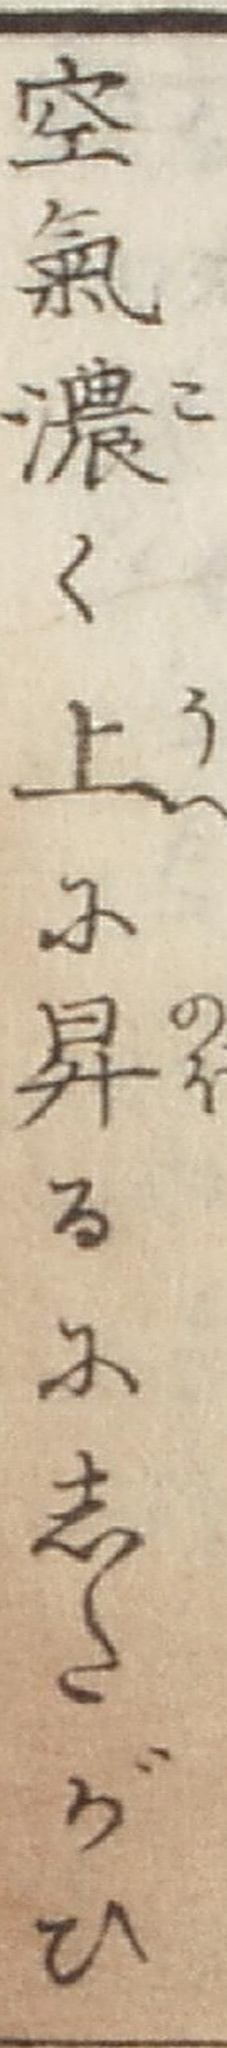空気濃く上に昇るにしたがひ
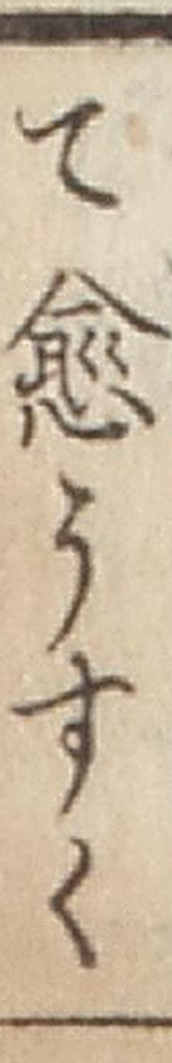て愈うすく
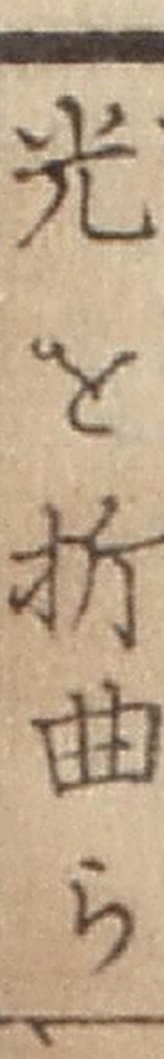光を折曲ら
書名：変異辯　一名、天變地異拾遺　全
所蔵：東京大学地震研究所図書室 Earthquake Research Institute Library, The University of Tokyo, JAPAN
